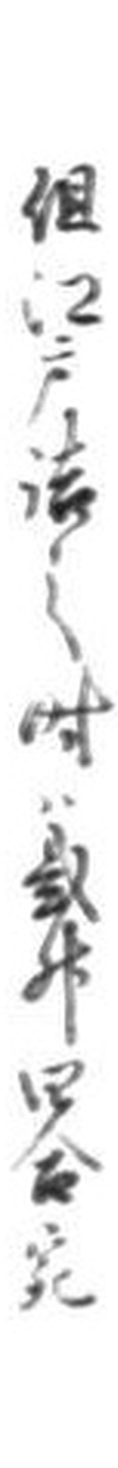但江戸詰之時ハ弐升四合宛
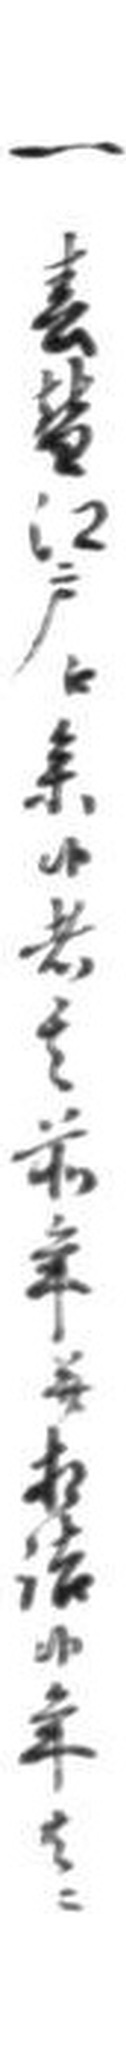一春替江戸江参候者其前年并相勤候年共ニ
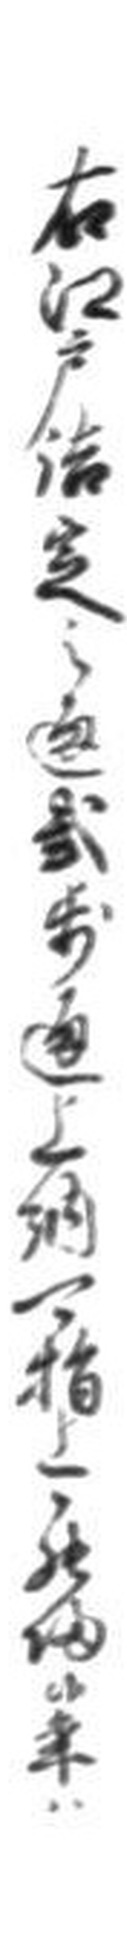右江戸詰定之通弐歩通上納可指上罷帰候年ハ
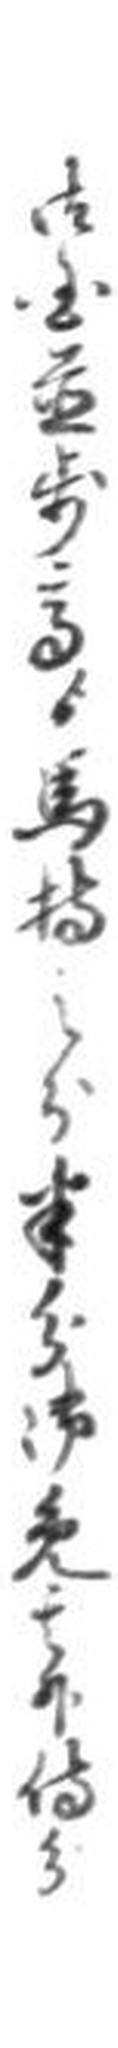御国並歩高ゟ馬持之分半分御免其外侍分

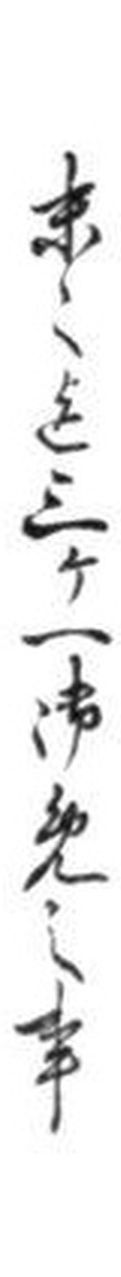末々迄三ケ一御免之事
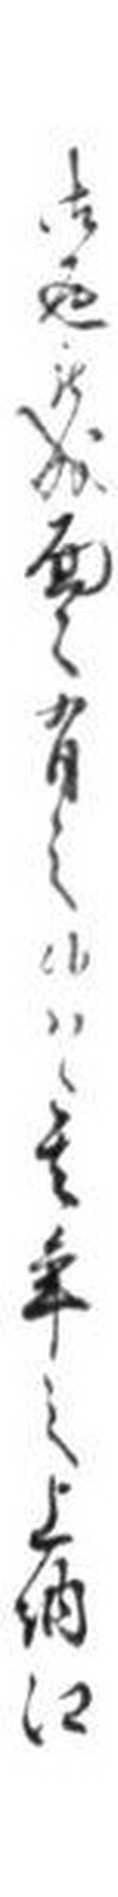御返被成面々有之候ハヽ其年之上納江
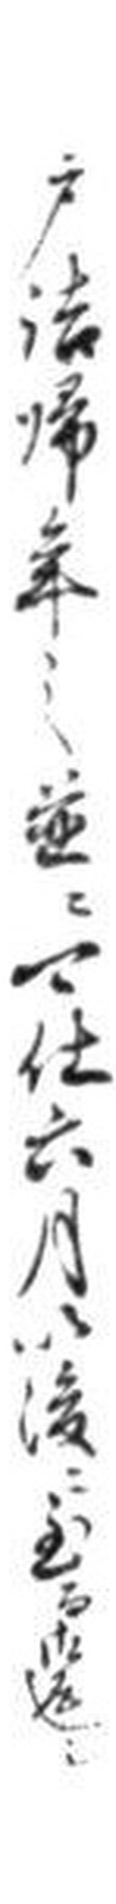戸詰帰年之並ニ可仕六月以後ニ至而御返シ
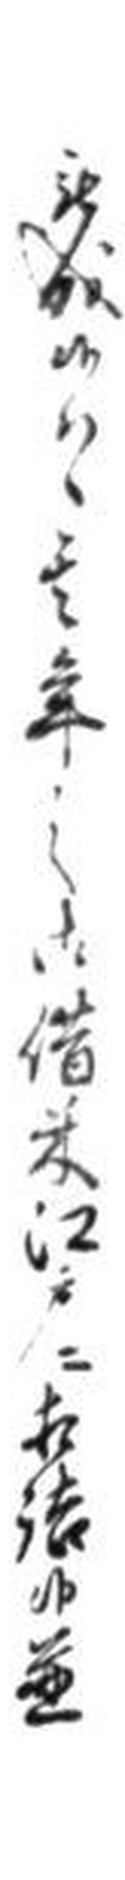被成候ハヽ其年之御借米江戸ニ相詰候並
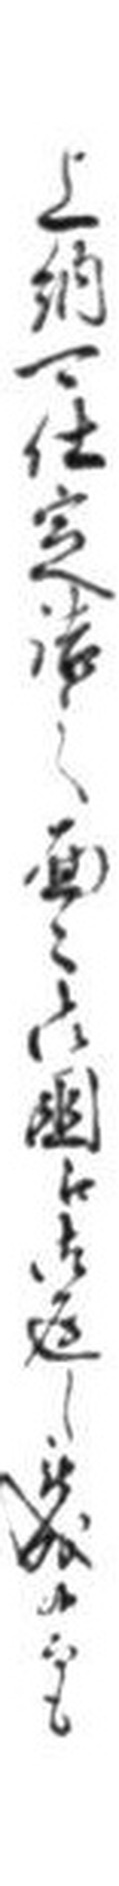上納可仕定詰之面々御国江御返し被成候而も
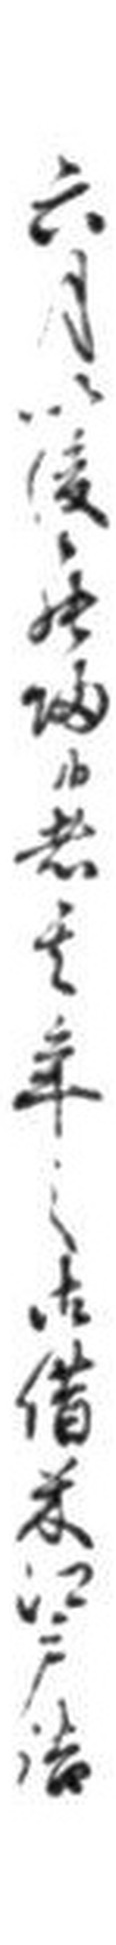六月以後罷帰候者其年之御借米江戸詰
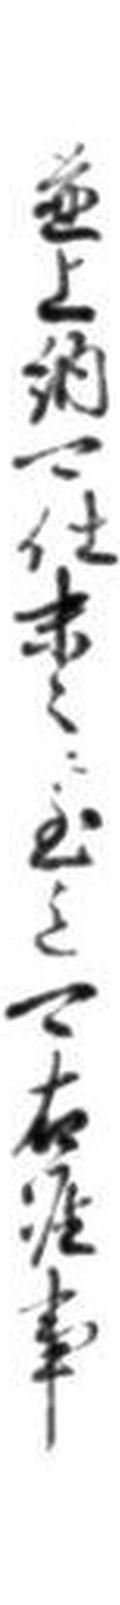並上納可仕末々ニ至迄可右准事
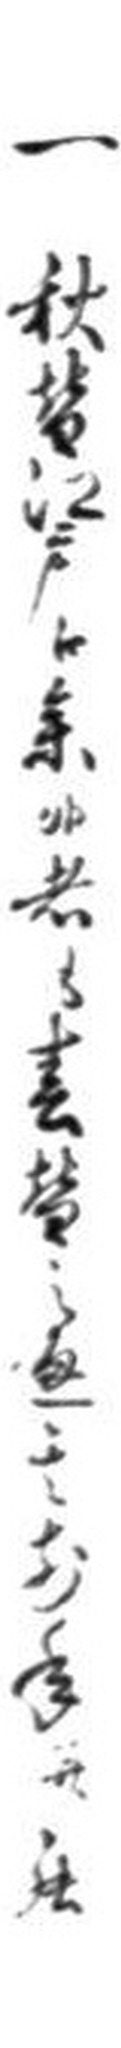一秋替江戸江参候者も春替之通其前年并罷
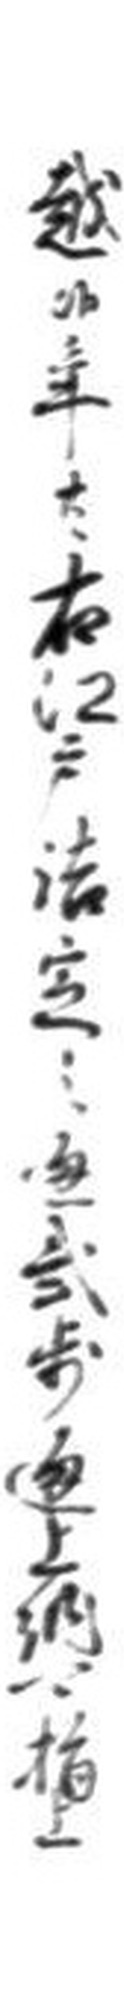越候年共右江戸詰定之通弐歩通上納可指上
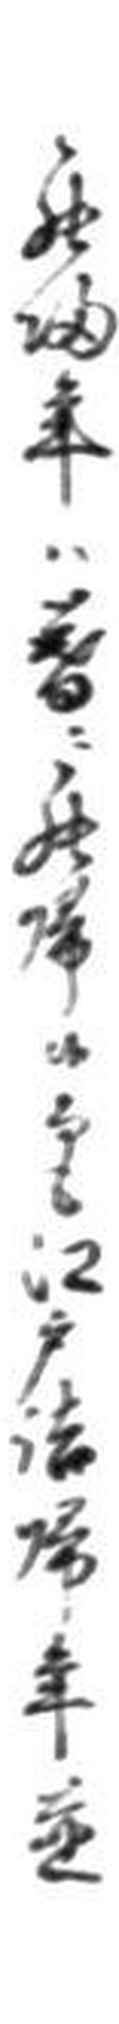罷帰年ハ暮ニ罷帰候而も江戸詰帰年並
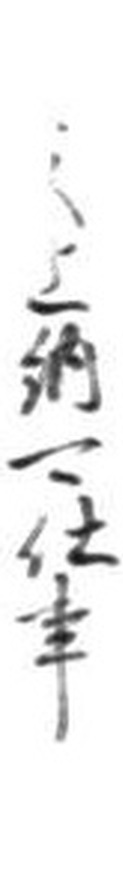之上納可仕事
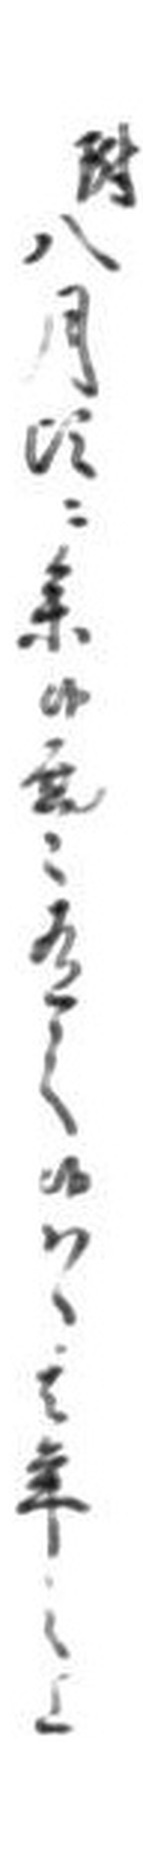八月頃ニ参候面々有之候ハヽ其年之上
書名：家譜 三十八 宗矩公 従享保九年五月到享保九年十二月
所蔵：福井県文書館 Fukui Prefectural Archives
